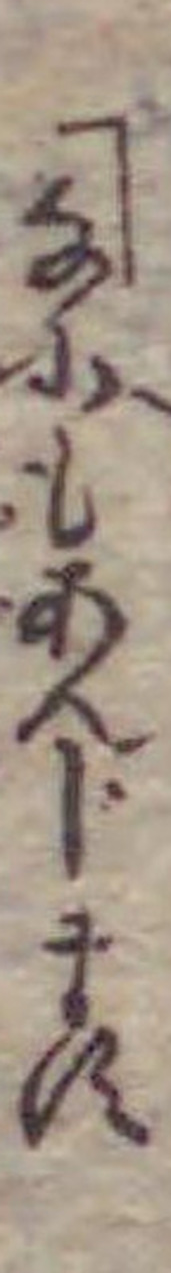〽なにもあんじます
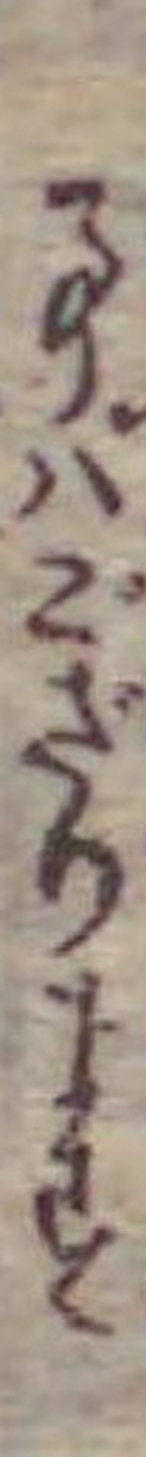事はござります
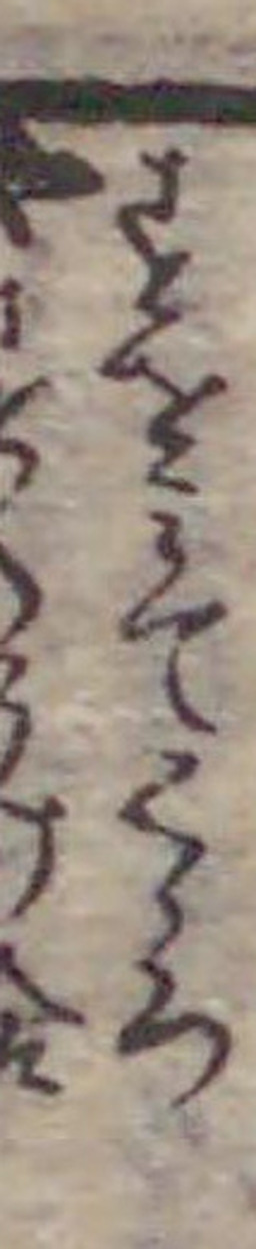やすくうけ合
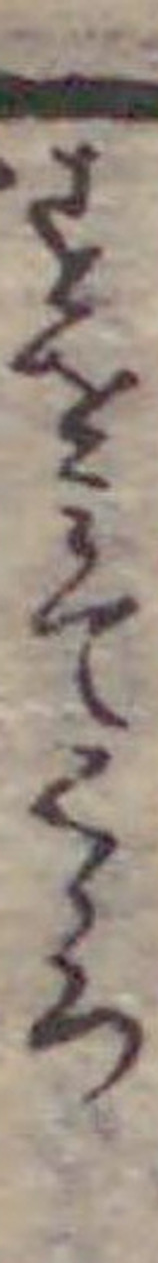すをみてこゝろ
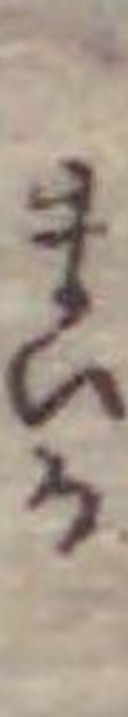まいか
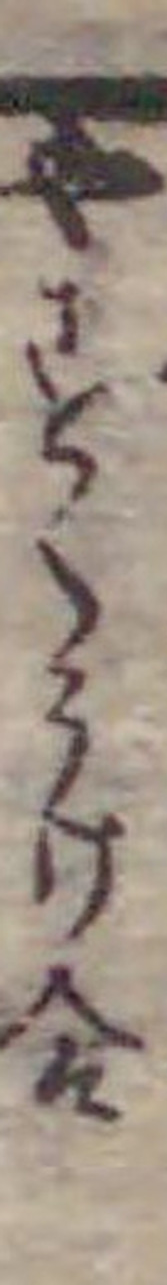やすくうけ合
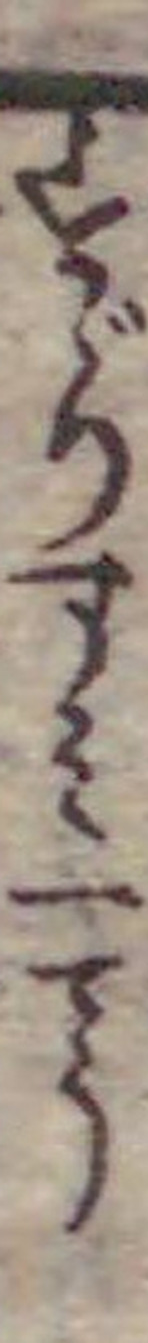すゞりすみ一てう
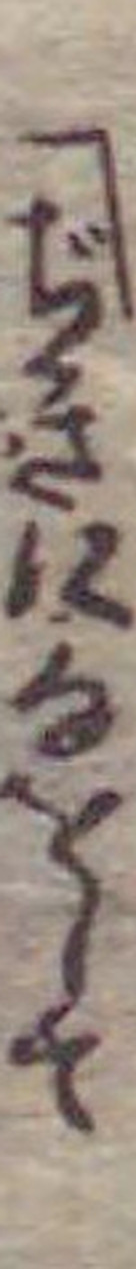〽ぢきになをして
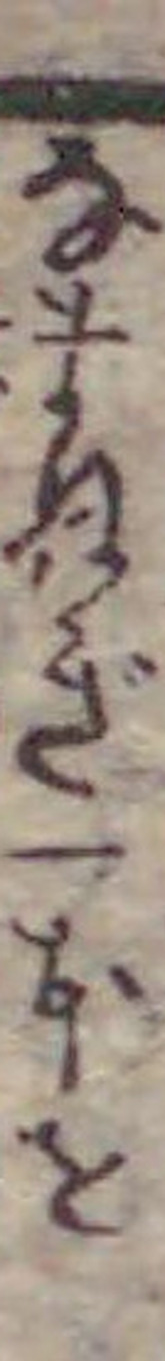なまねぎ一本を
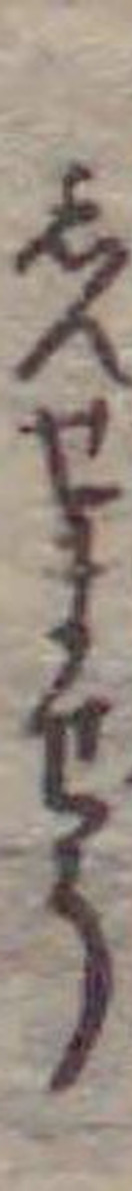しんぜませう
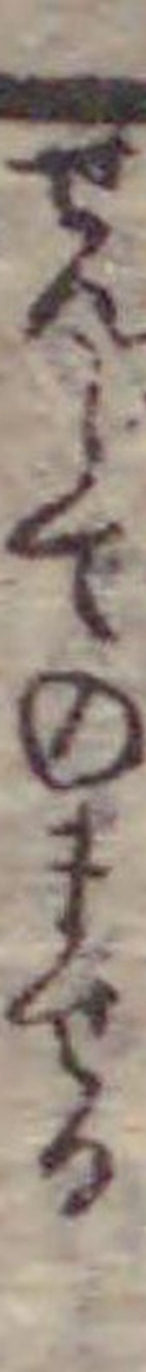せんじてのませる
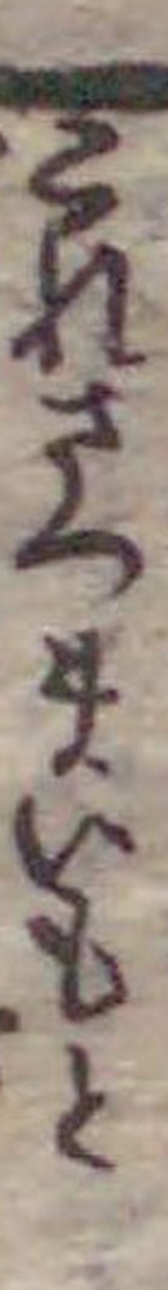これさつまいもと
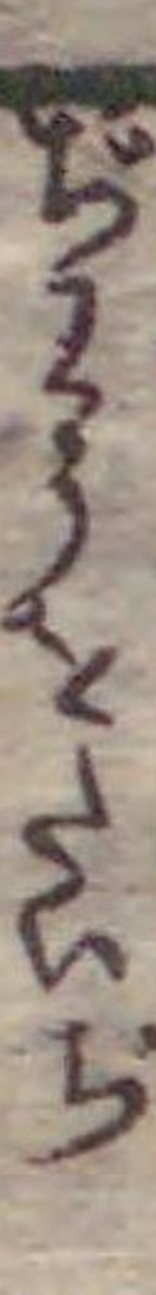ぢわうをたいぢ
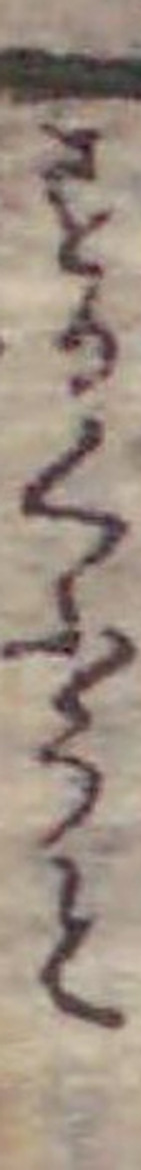するくふうと

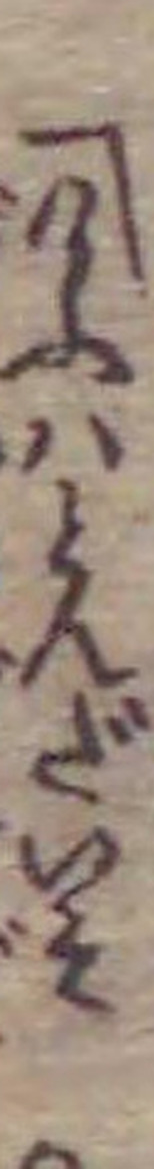〽けふはとんだいそ
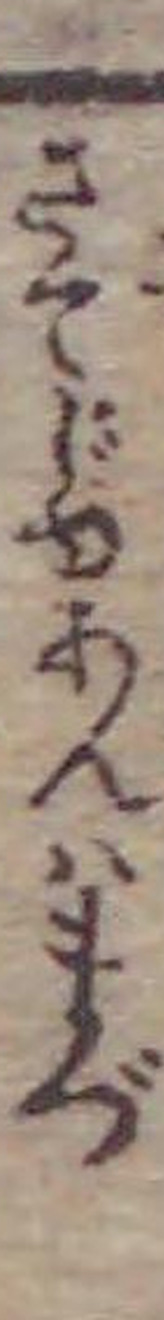さてじゆあんはまづ
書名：鼻下長生薬 : 3巻
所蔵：国立国会図書館 National Diet Library, JAPAN
